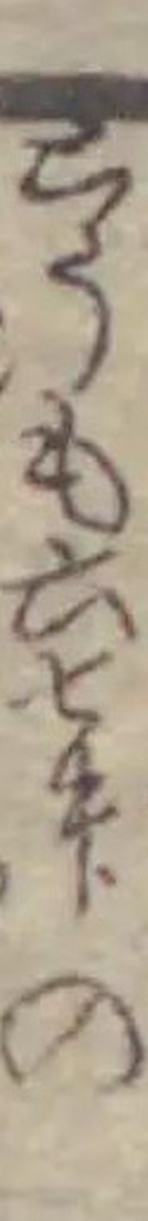とうも六七升の
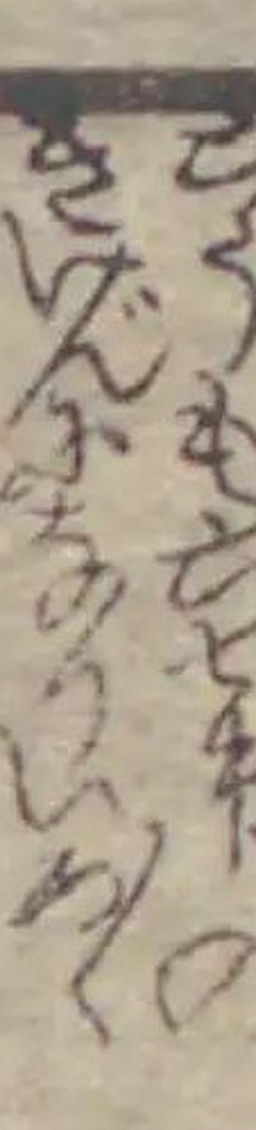きげんになりいろ〳〵
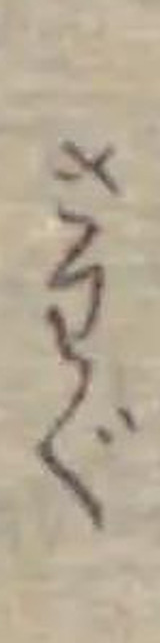さわぐ
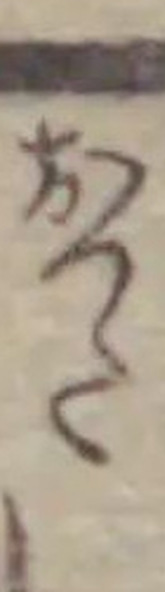おつた

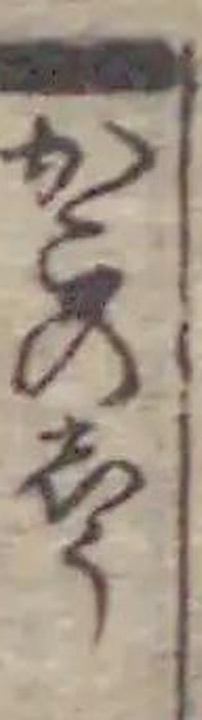かごのしう
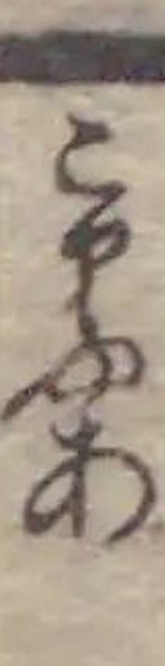こりやあ
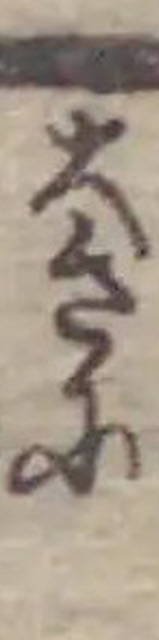大きに
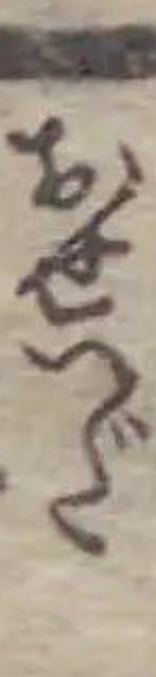おせわだ
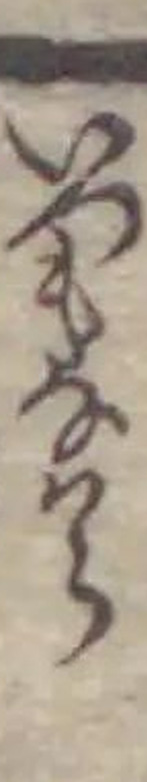いつもなから
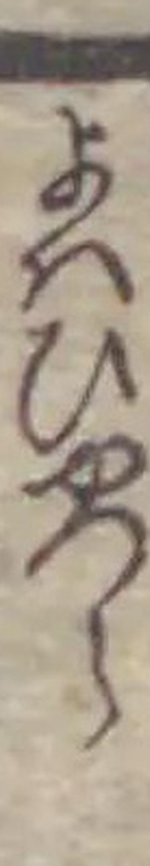よはひやつら
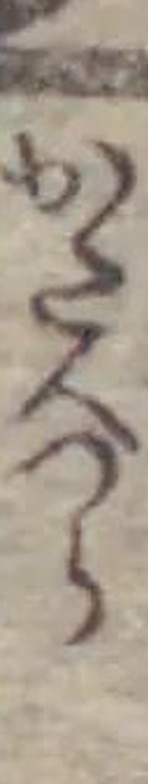かたへつか
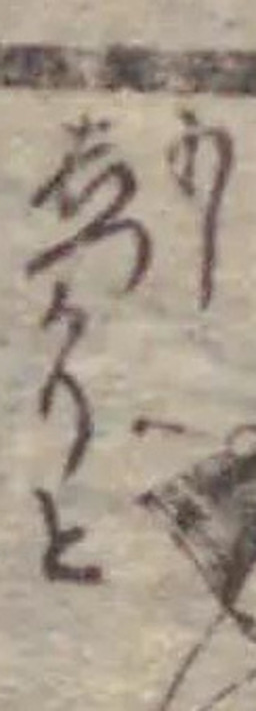しつかりと
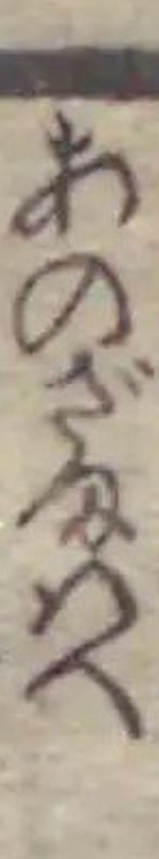あのざまはへ
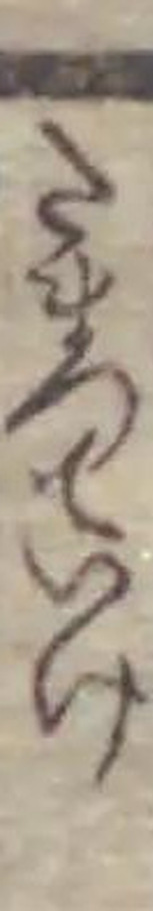たまつていけ
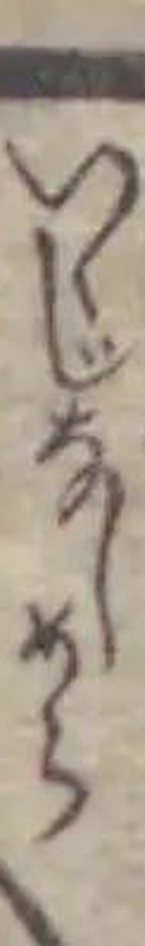いくじなしめら
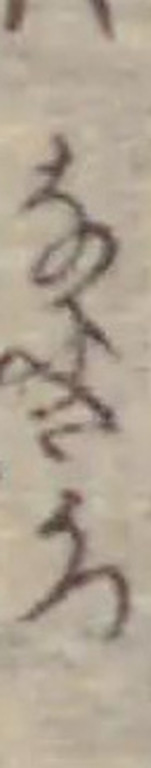なにさうつ
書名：藝者五人娘 2巻
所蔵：国立国会図書館 National Diet Library, JAPAN
